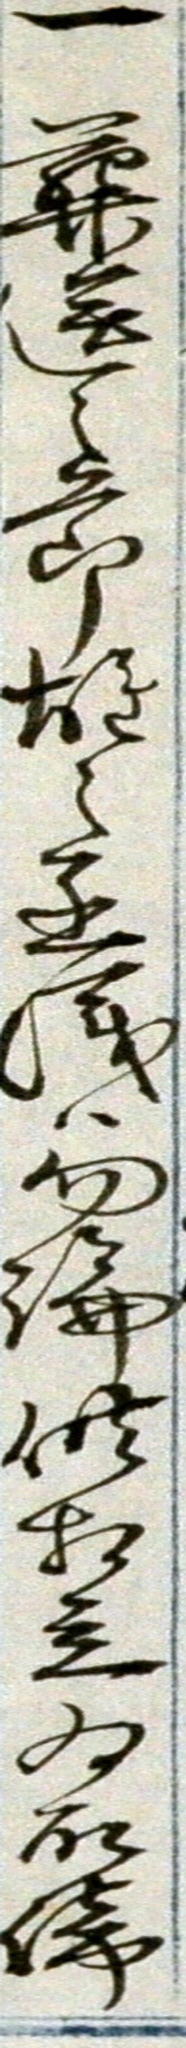一葬送之節雄之丞儀ハ勿論供相立為取締
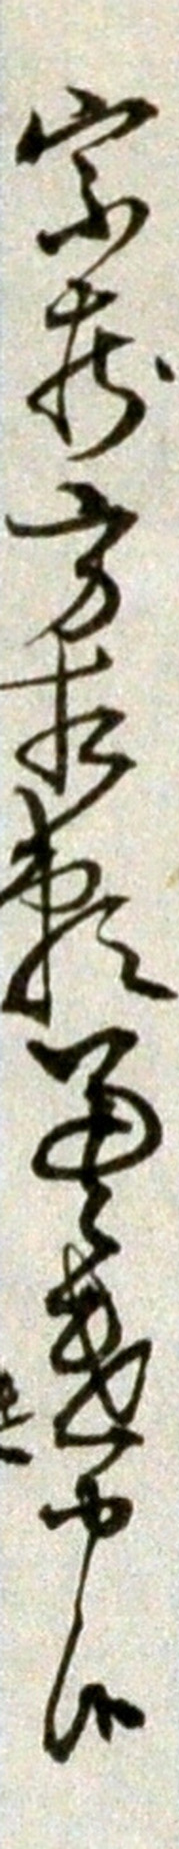宗蔵方相頼差遣申候
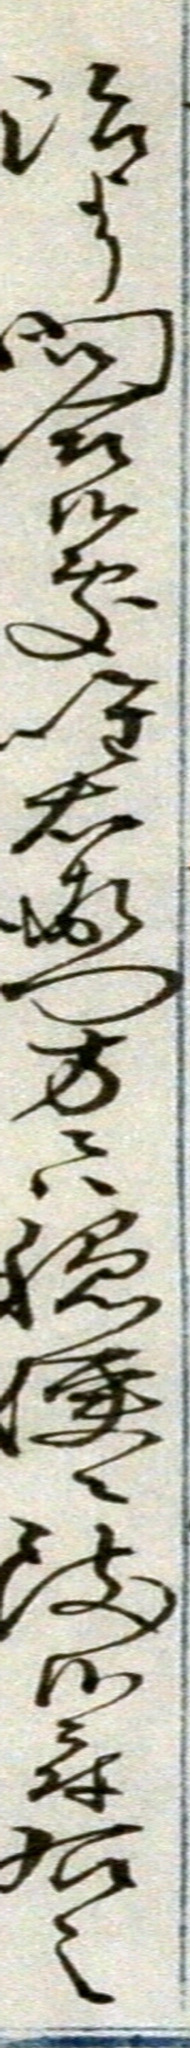治より問合候處唯右衛門方ニハ穏便ニ致候ニ付右之
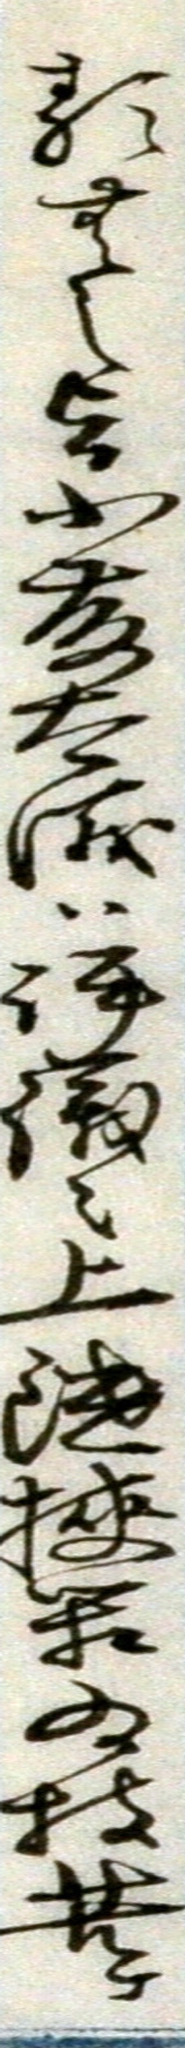類無之旨小藤太儀ハ評議之上鑓挟箱為持苦ヶ
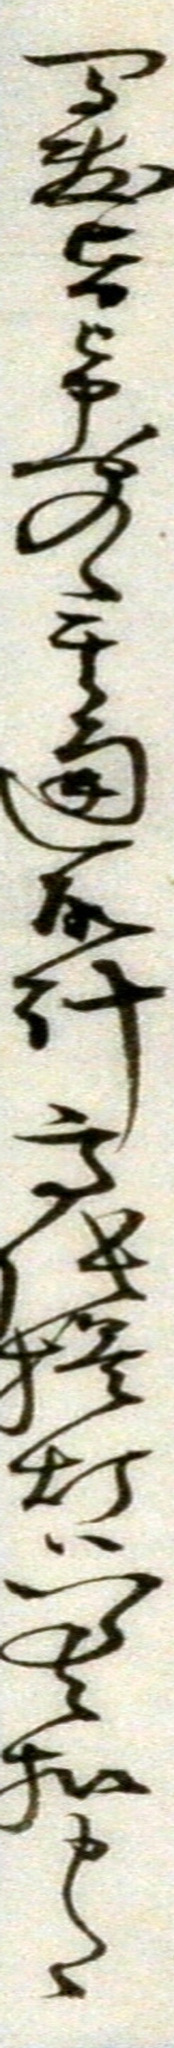間敷旨被申聞候其通取計高張提灯ハ差扣申候
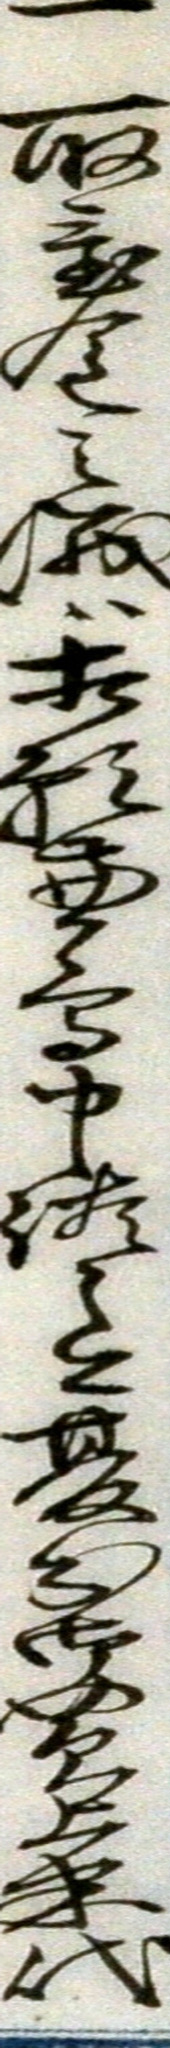一取置金之儀ハ相願兼候間申談之上夏分御買上米代
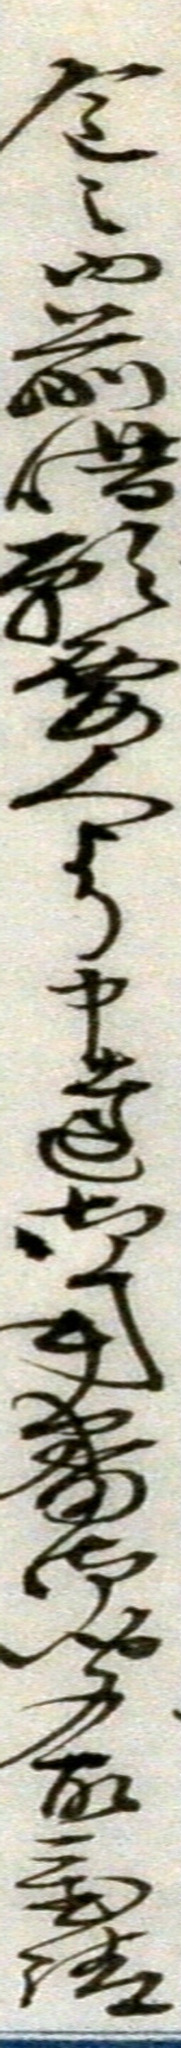金之内前借願要人より申達御用番御聞取置請
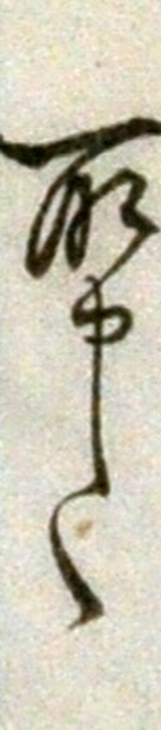取申候
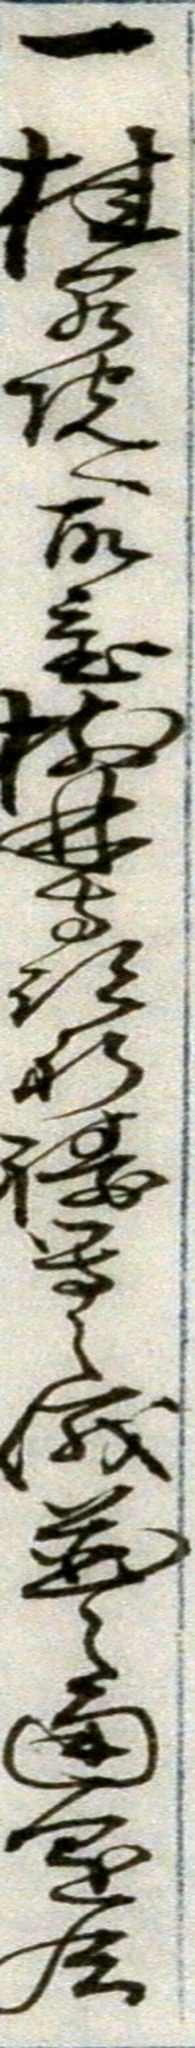一桂泉院へ取置樹林寺諸祈祷等之儀並之通懸合
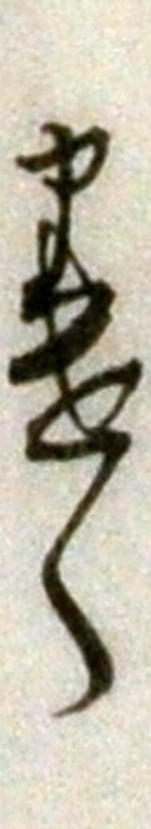申遣候
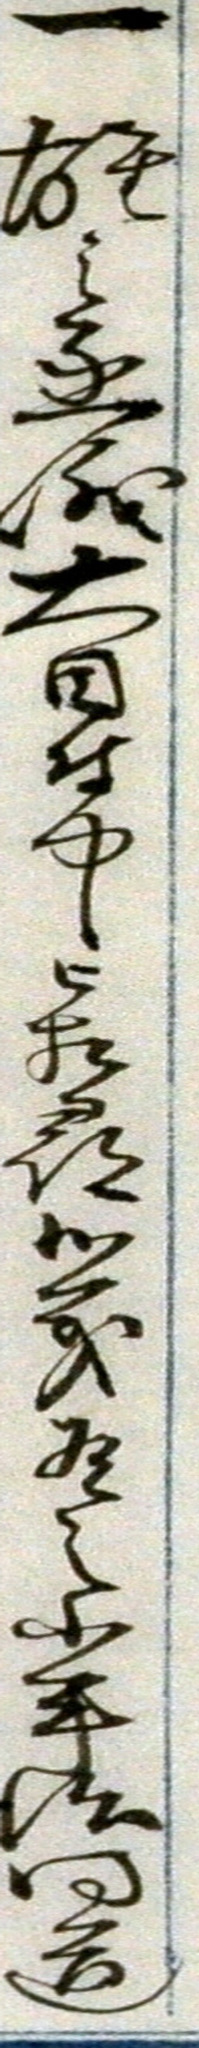一雄之丞儀大目付中被相尋候義有之小平治同道
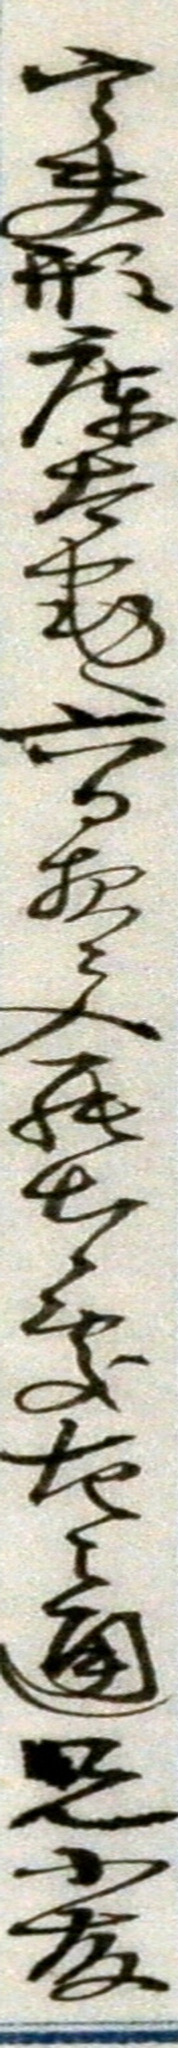宇夫形庫太宅へ六日夜ニ入罷出候處左之通兄小藤
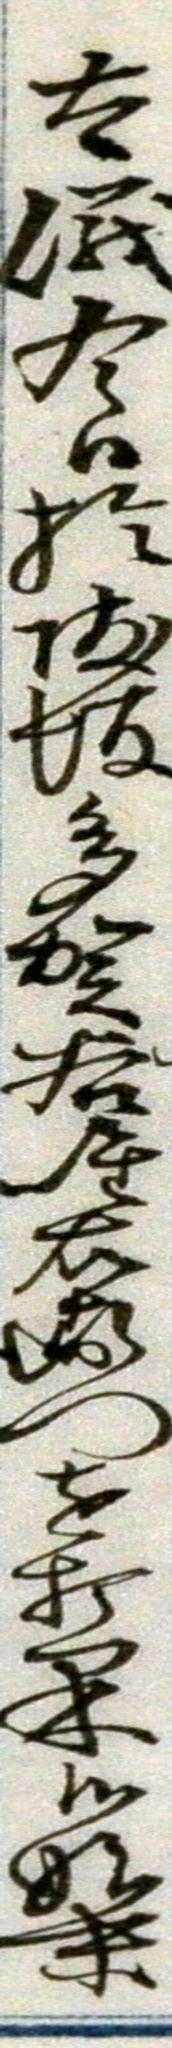太儀今日於殿坂多賀谷唯右衛門を討果候始末
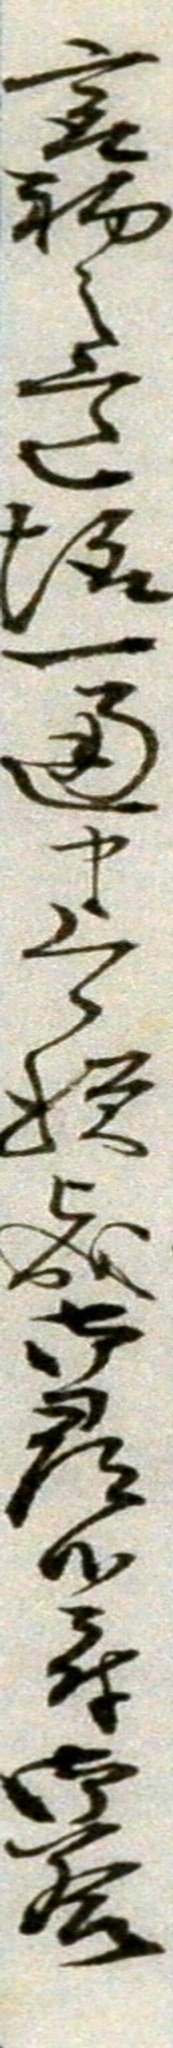最初之意趣一通申上候様被成御尋候ニ付御答
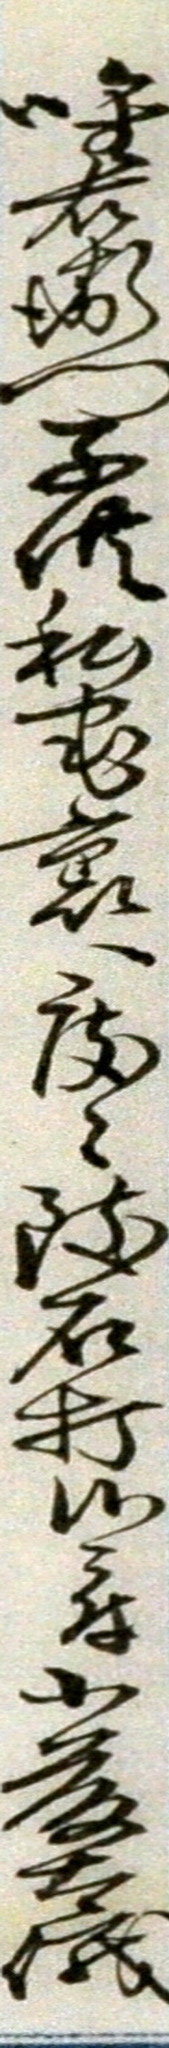唯右衛子供私宅裏へ度々致石打候ニ付小藤太儀
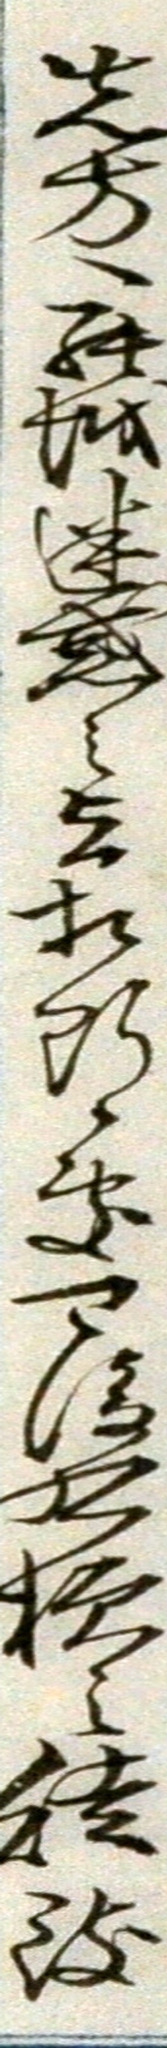先方へ罷越迷惑之旨相断候處已後右様之徒致
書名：川面小藤太子細有之多賀谷唯右衛門ヲ打果候一件
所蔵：伊那市立高遠町図書館・合同会社AMANE
